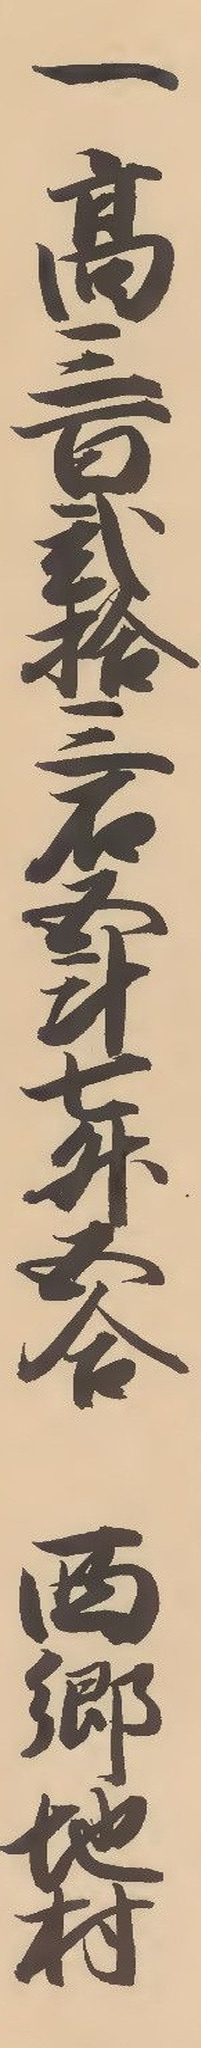一高三百弐拾三石五斗七升五合西郷地村

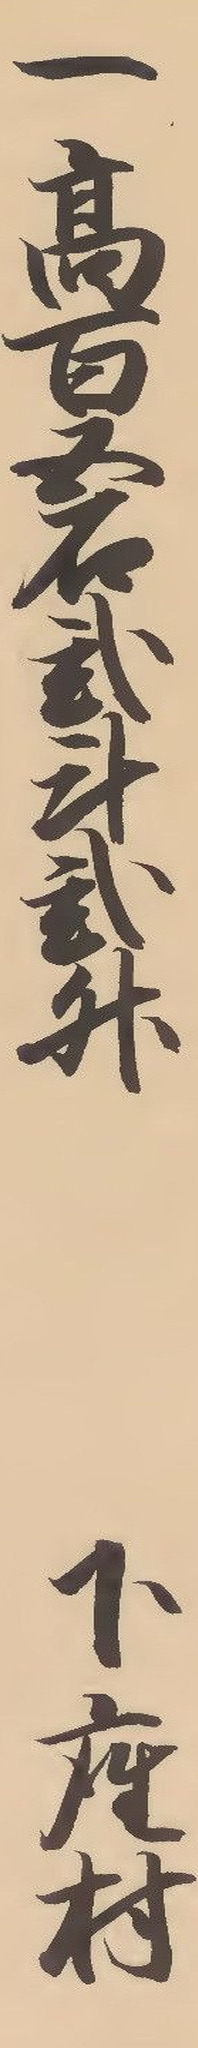一高百五石弐斗弐升下座村
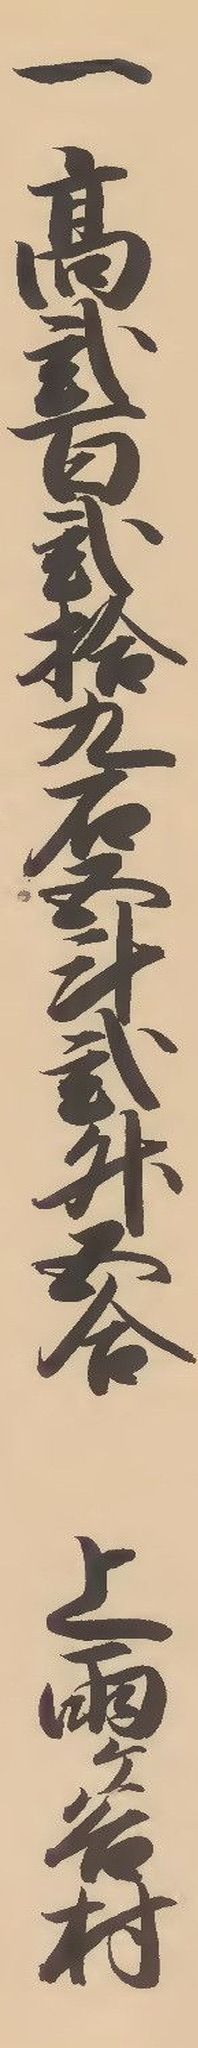一高弐百弐拾九石五斗弐升五合上雨ヶ谷村
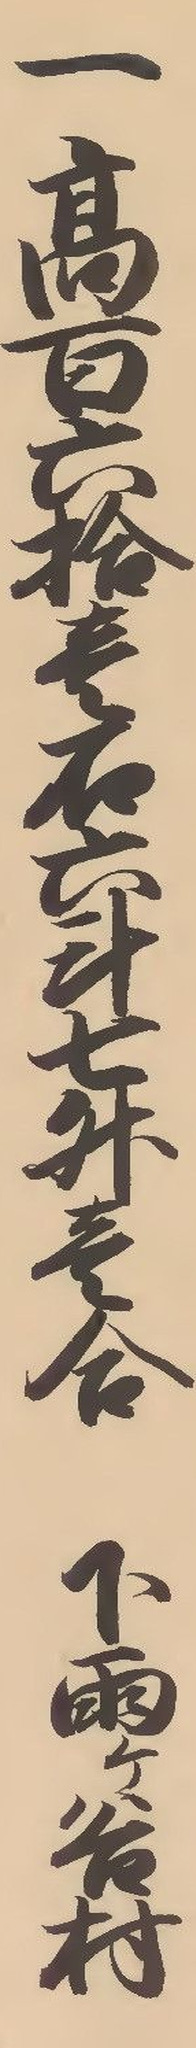一高百六拾壱石六斗七升壱合下雨ヶ谷村
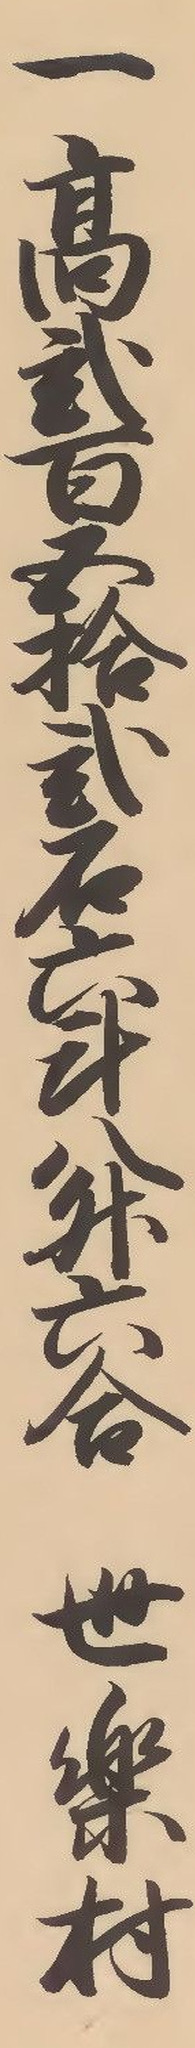一高弐百五拾弐石六斗八升六合世楽村
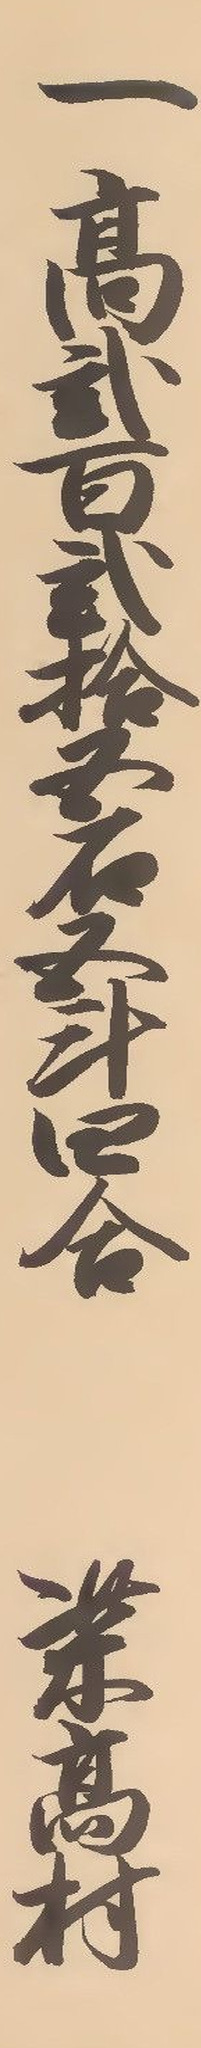一高弐百弐拾五名五斗四合柴高村
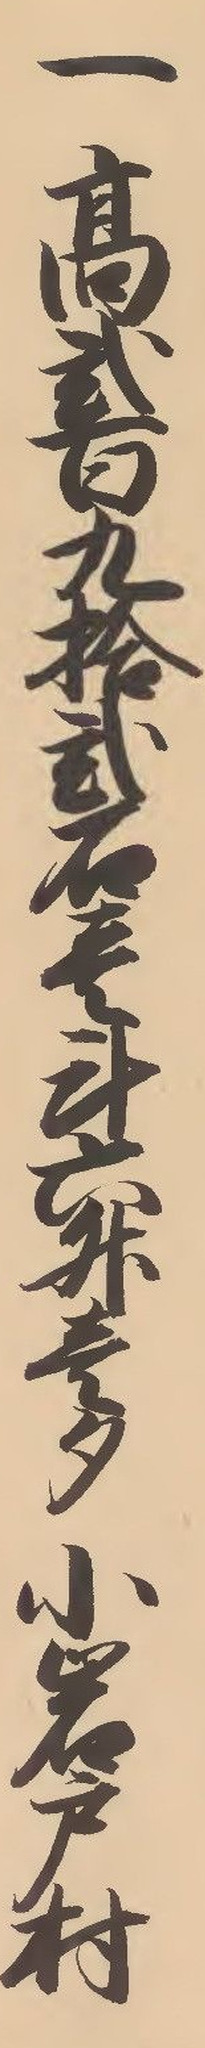一高弐百九拾弐石壱斗六升壱勺小岩戸村
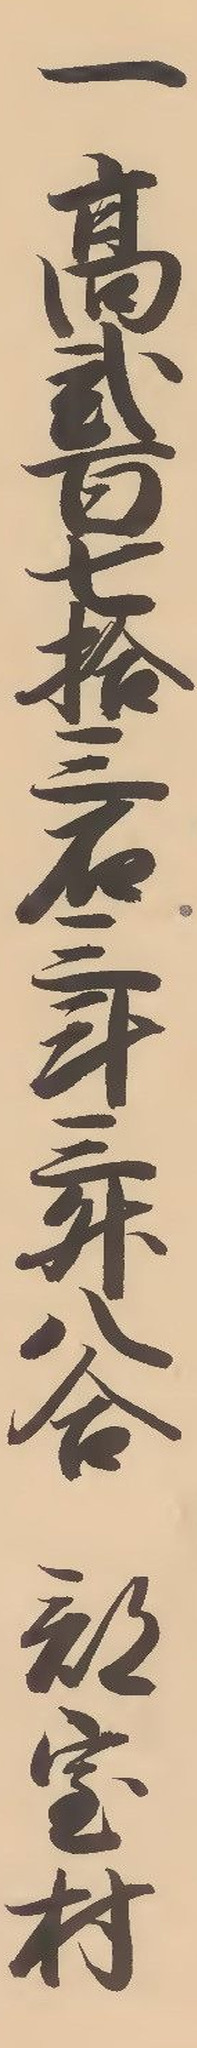一高弐百七拾三石三斗三升八合部室村
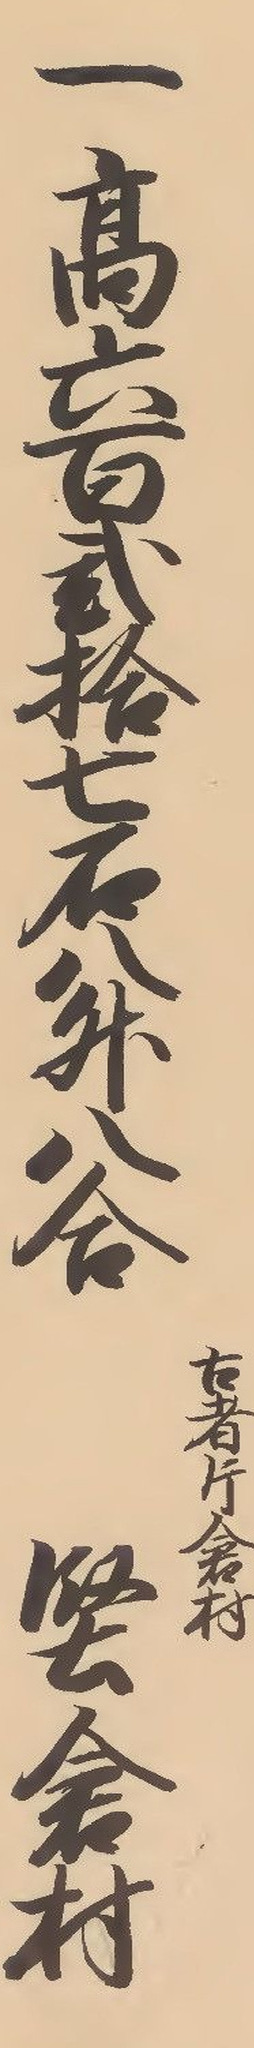一高六百弐拾七石八升八合堅倉村

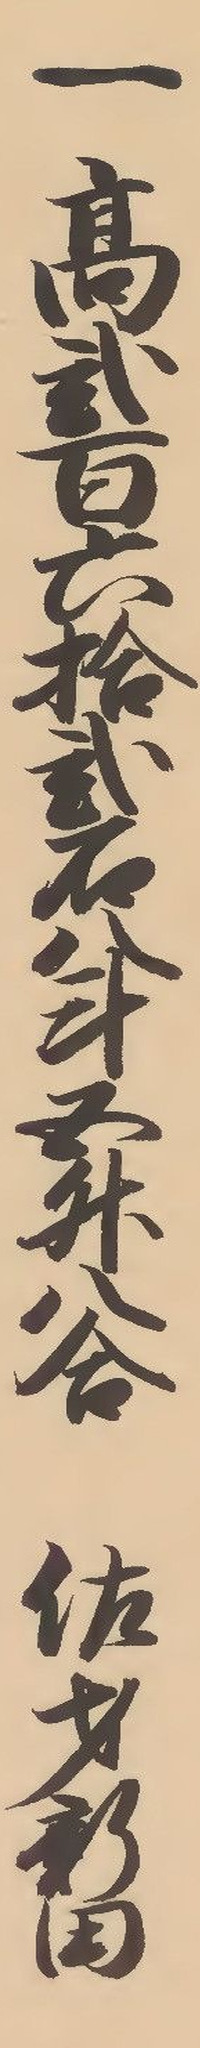一高弐百六拾弐石八斗五升八合佐才新田
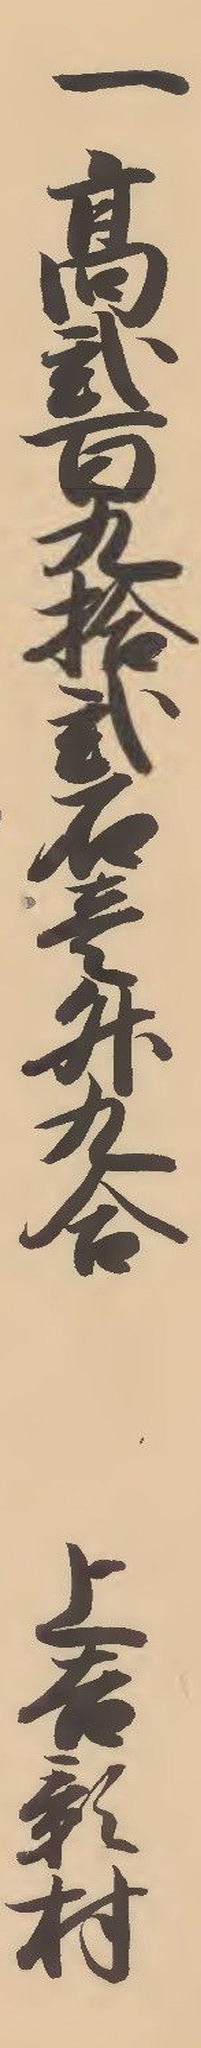一高弐百九拾弐石壱升九合上吉影村
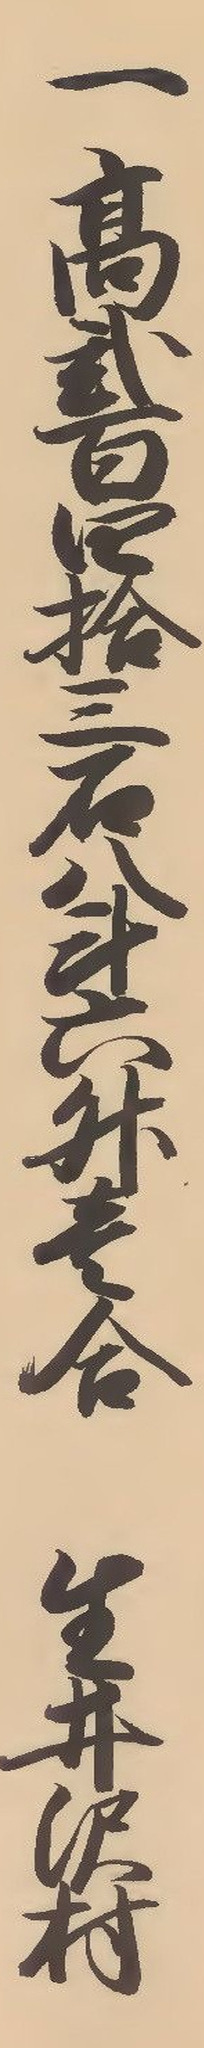一高弐百四拾三石八斗六升壱合生井沢村
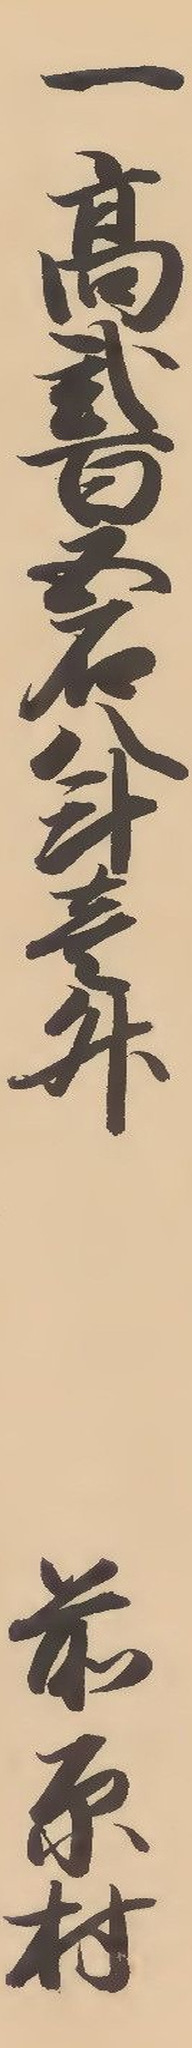一高弐百五石八斗壱升前原村
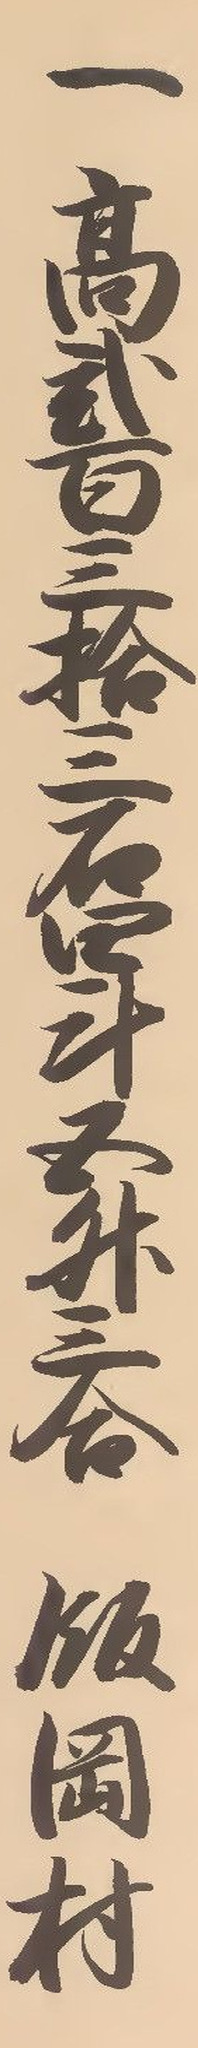一高弐百三拾三石四斗五升三合飯岡村
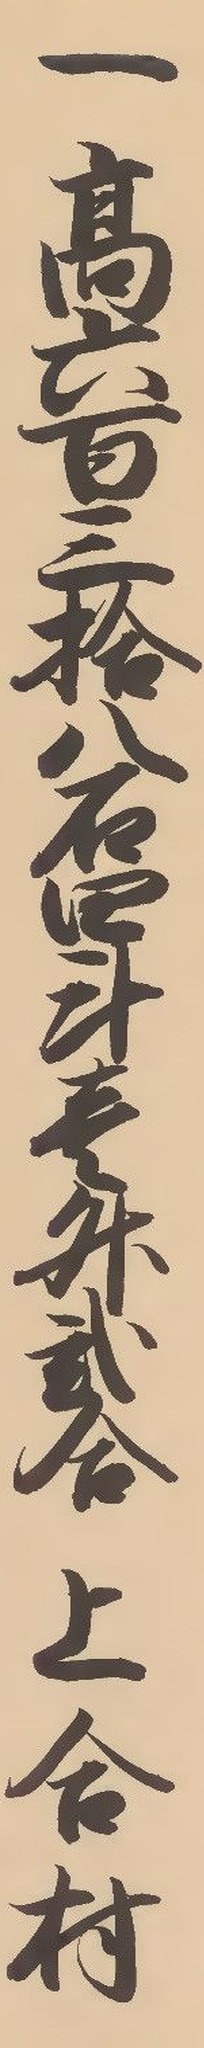一高六百三拾八石四斗壱升弐合上合村
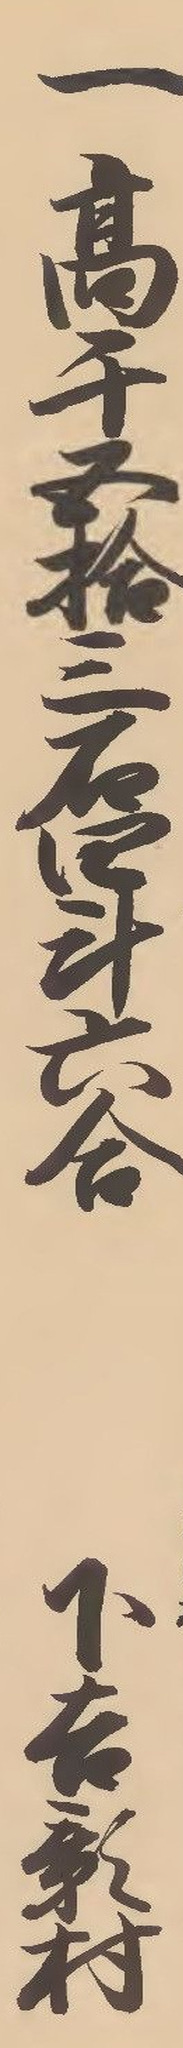一高千五拾三石四斗六合下吉影村
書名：常陸国郷帳
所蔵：国立公文書館 National Archives of Japan
